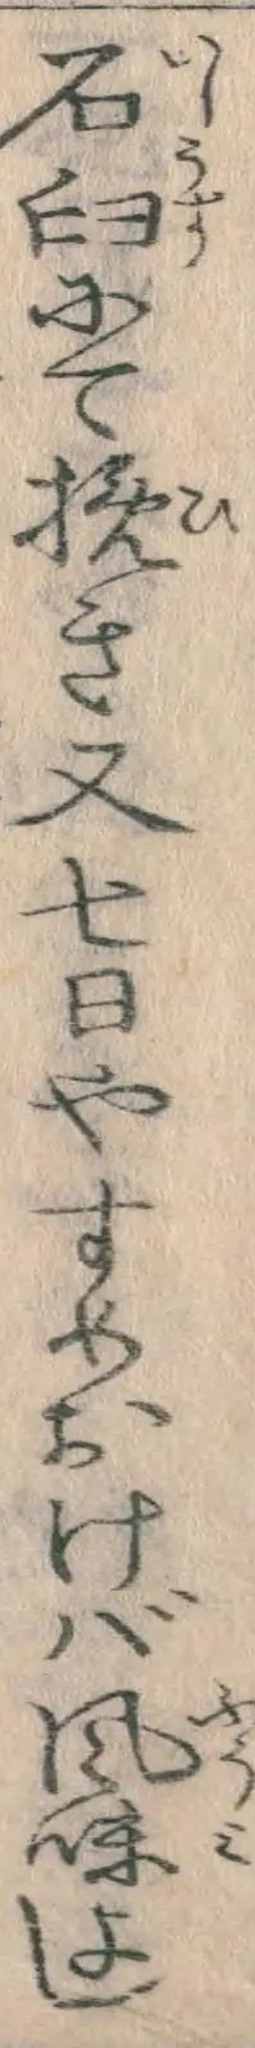石臼にて挽き又七日やすめおけば風味よし
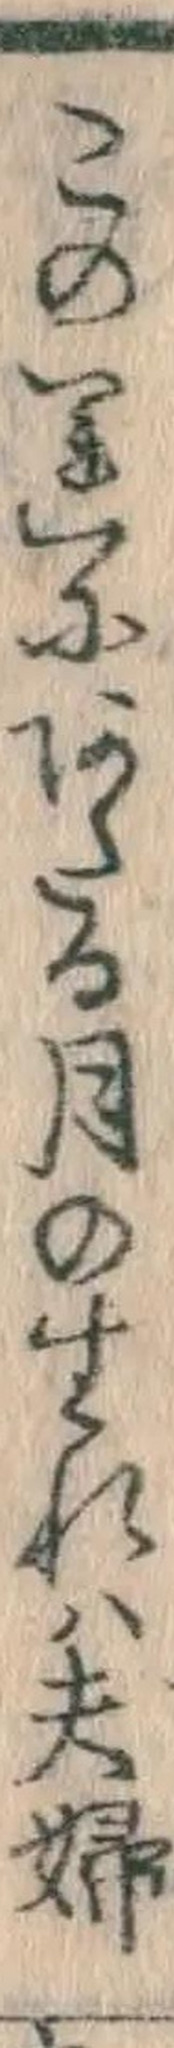この運にあたる月の生れは夫婦
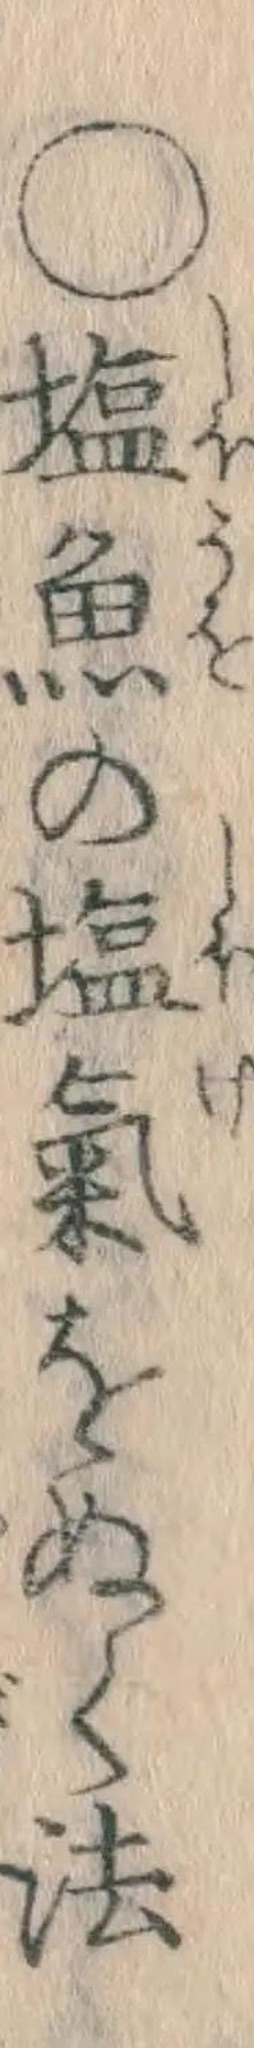○塩魚の塩気をぬく法
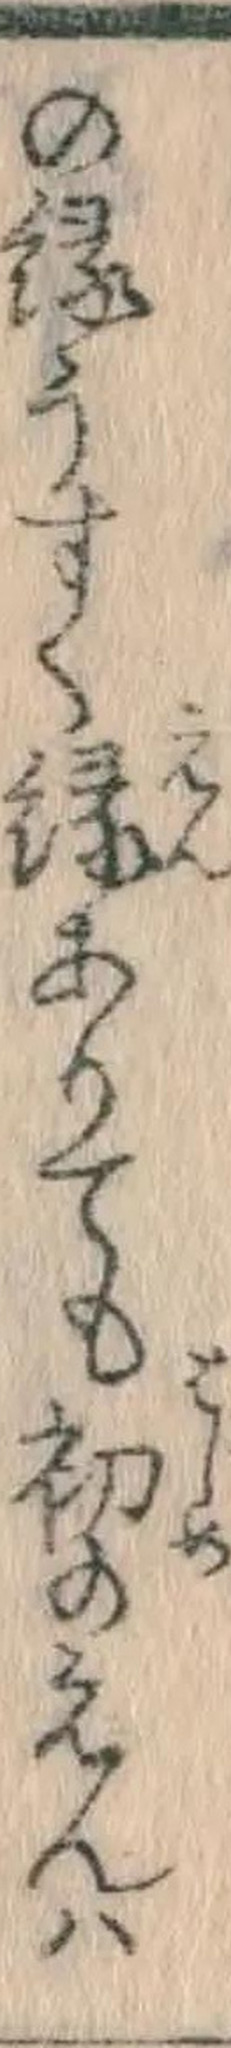の縁うすく縁ありても初のえんは
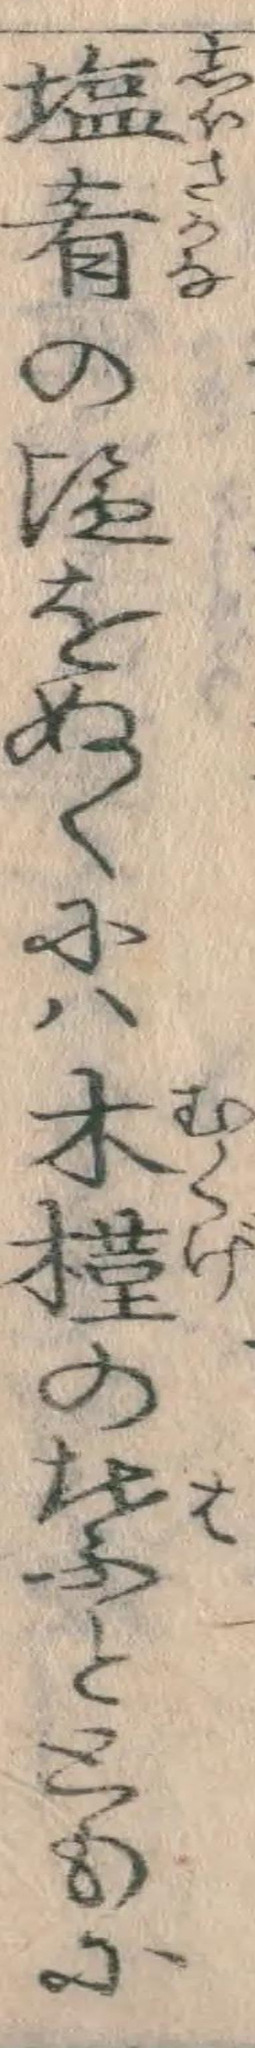塩肴の塩をぬくには木槿の葉とともに
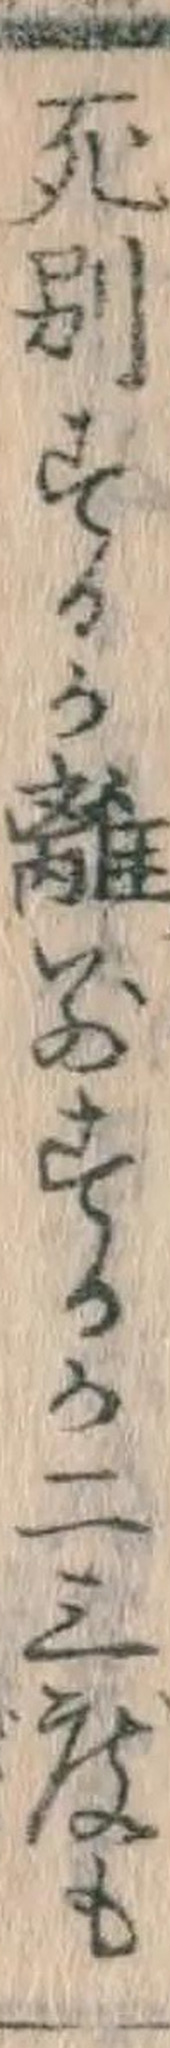死別するか離別するか二三度も
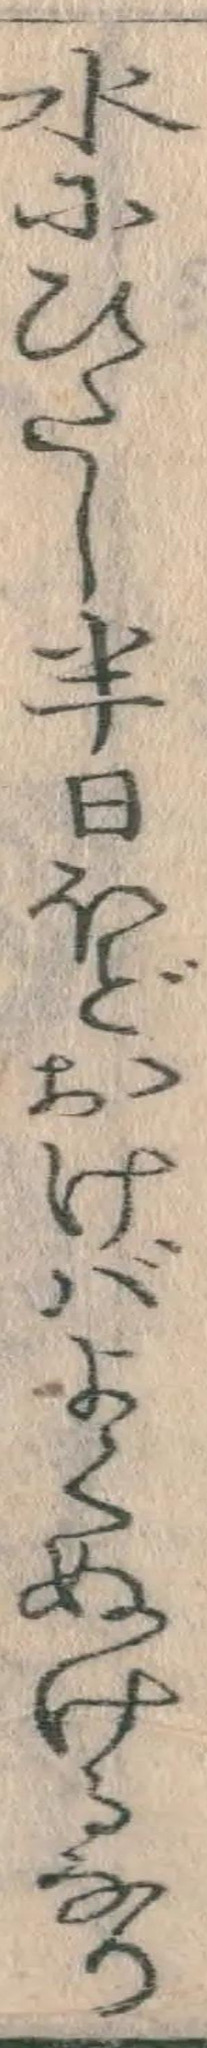水にひたし半日ほどおけばよくぬけるなり
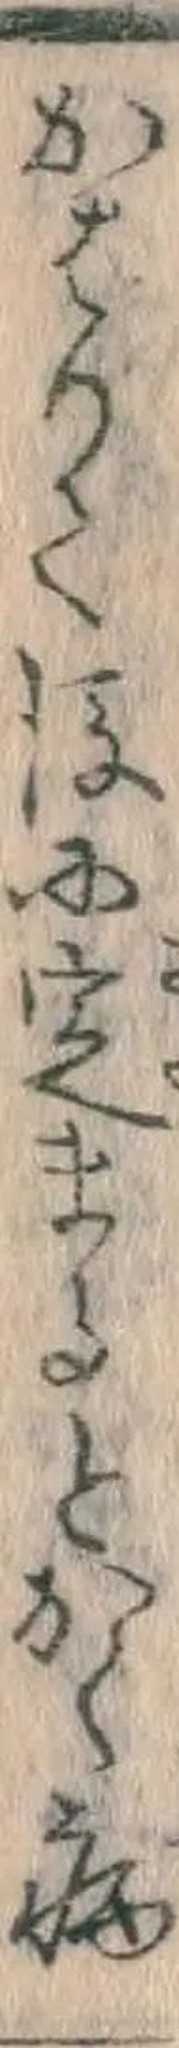かはりて後に定まるとかく病
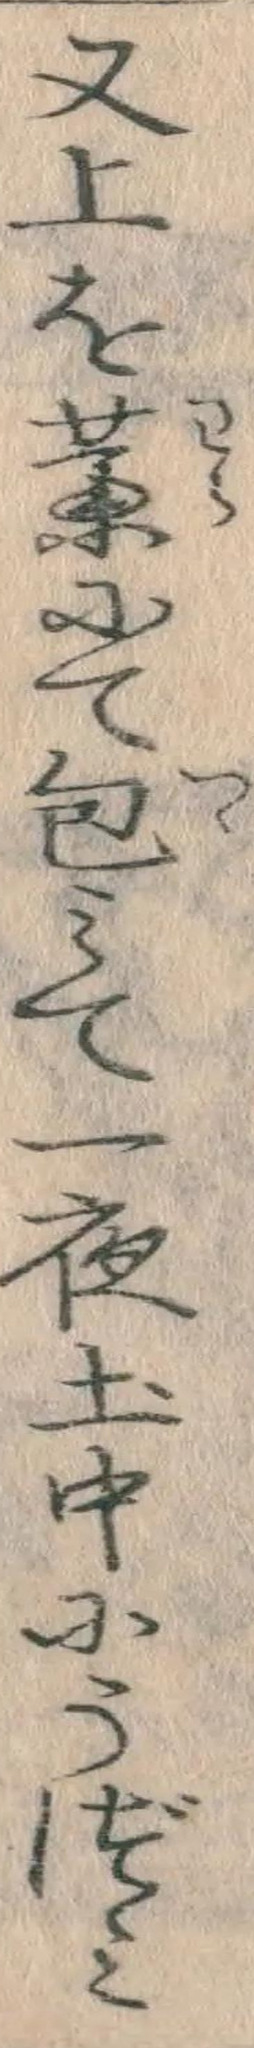又上を藁にて包みて一夜土中にうづみ
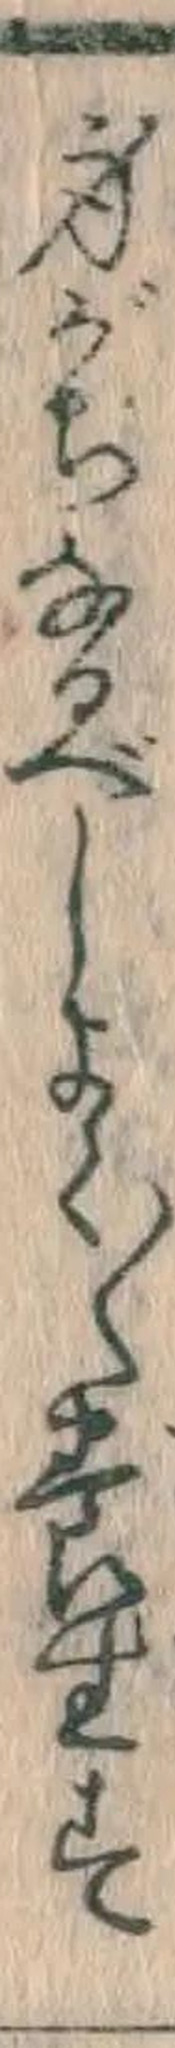身がちなるべしよく〳〵養生す
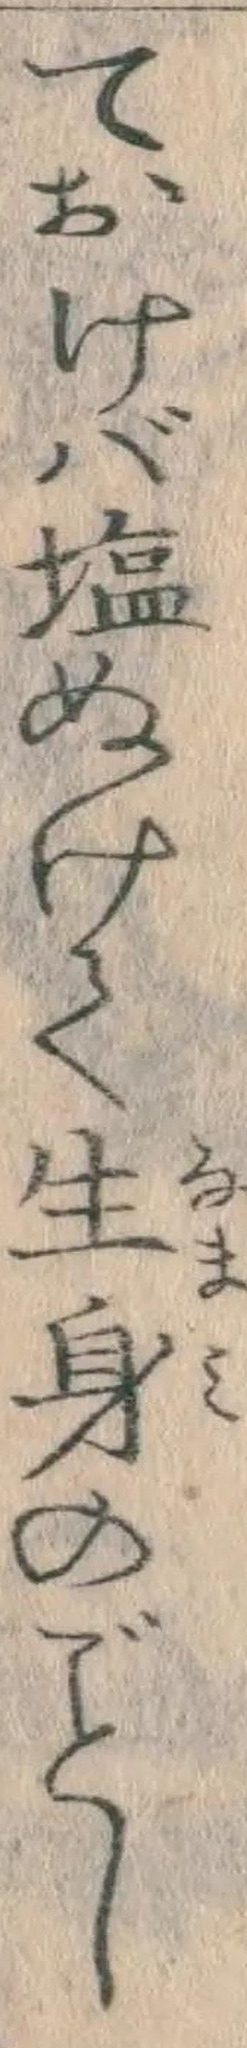ておけば塩ぬけて生身のごとし
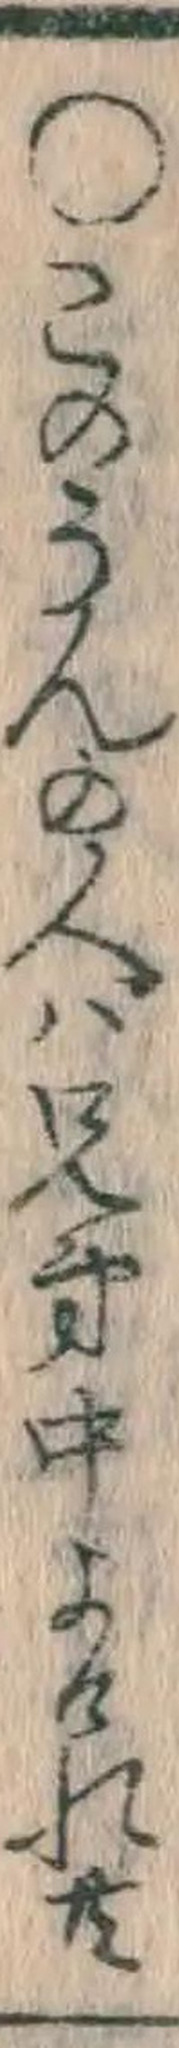○このうんの人は兄弟中よけれ共
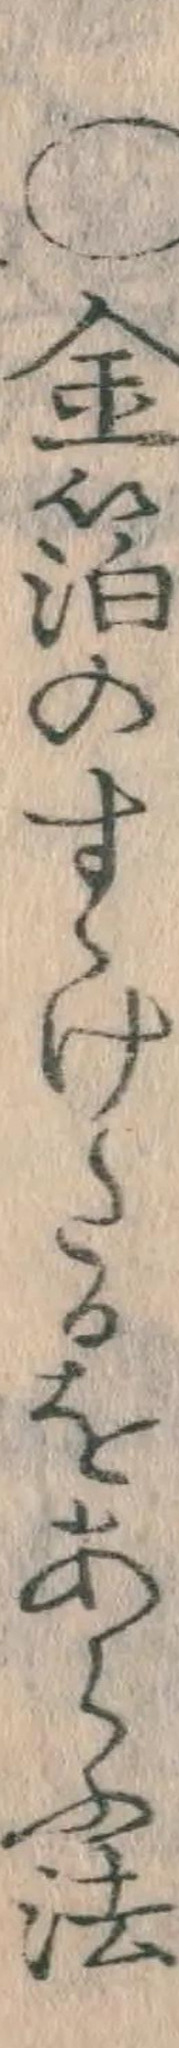○金箔のすゝけたるをあらふ法
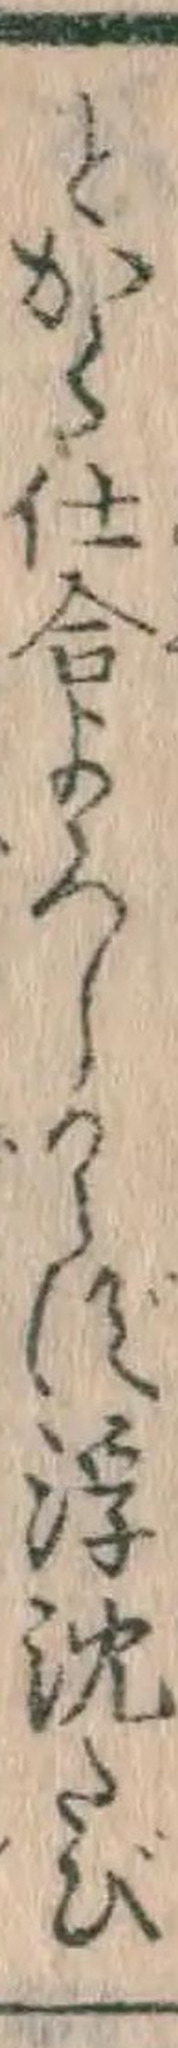とかく仕合よろしからず浮沈たび
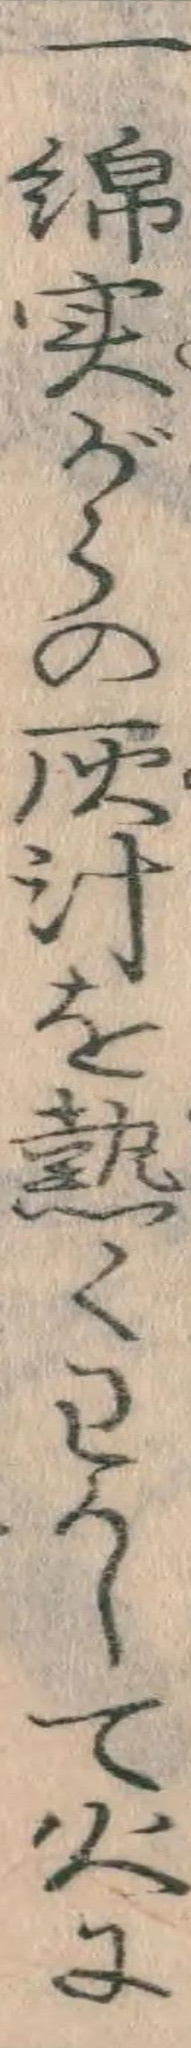一綿実がらの灰汁を熱くわかして火に
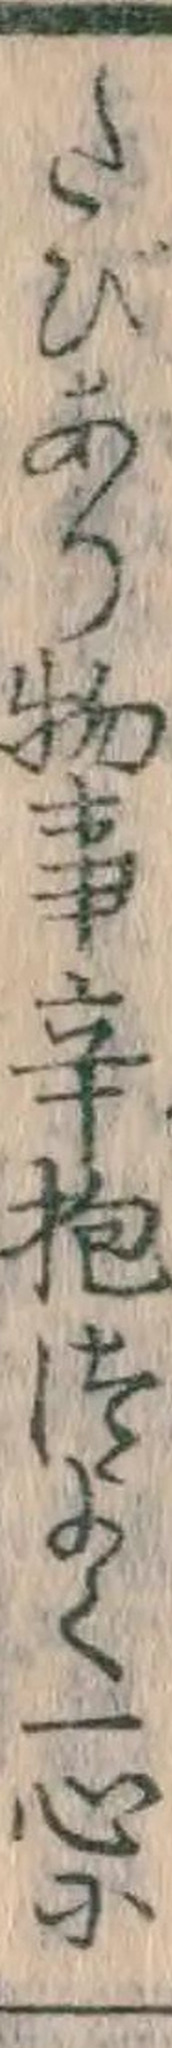たびあり物言辛抱つよく一心に
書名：広益秘事大全 3巻. [2]
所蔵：国立国会図書館 National Diet Library, JAPAN
